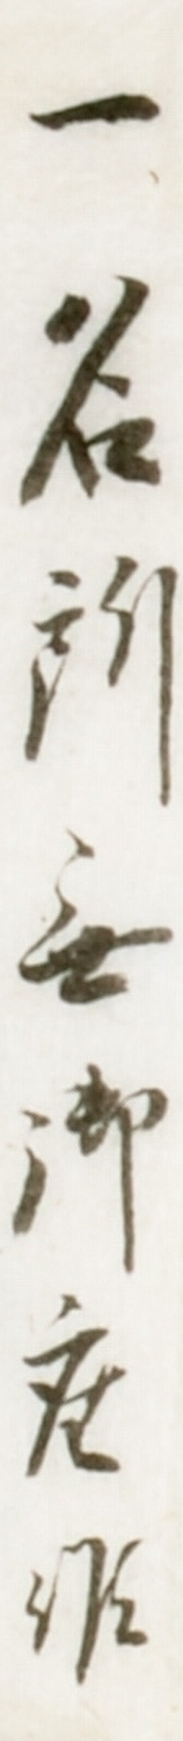一名所無御座候
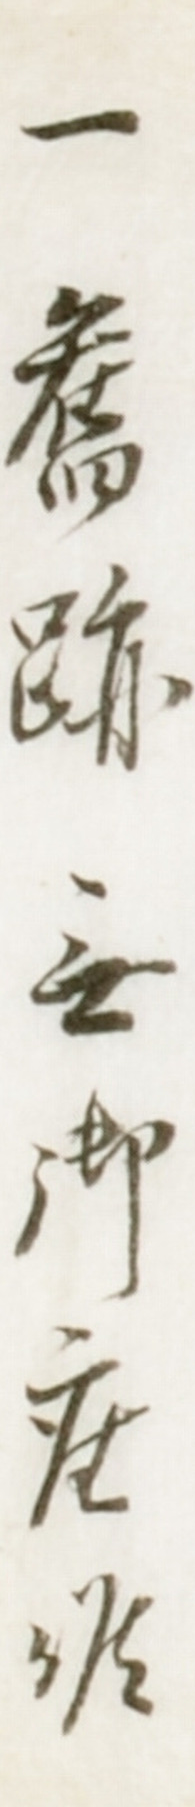一旧跡無御座候
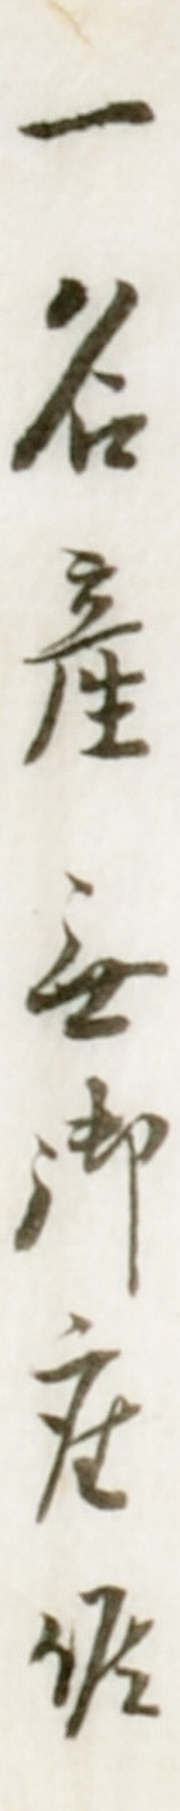一名産無御座候
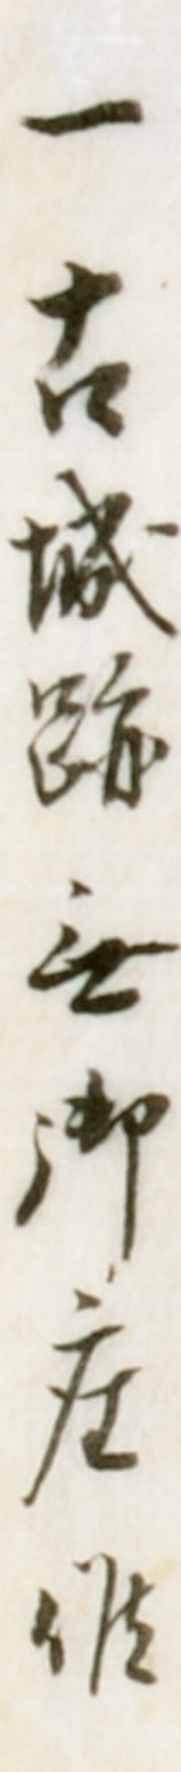一古城跡無御座候
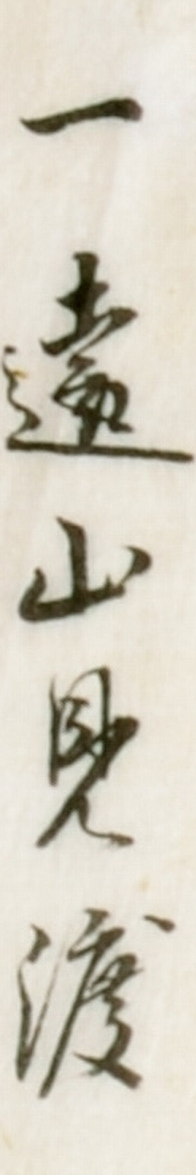一遠山見渡
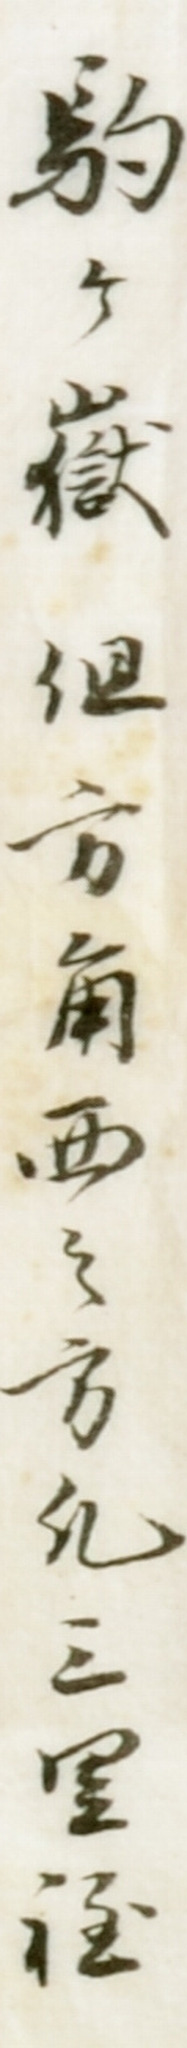駒ケ嶽但方角西之方凡三里程

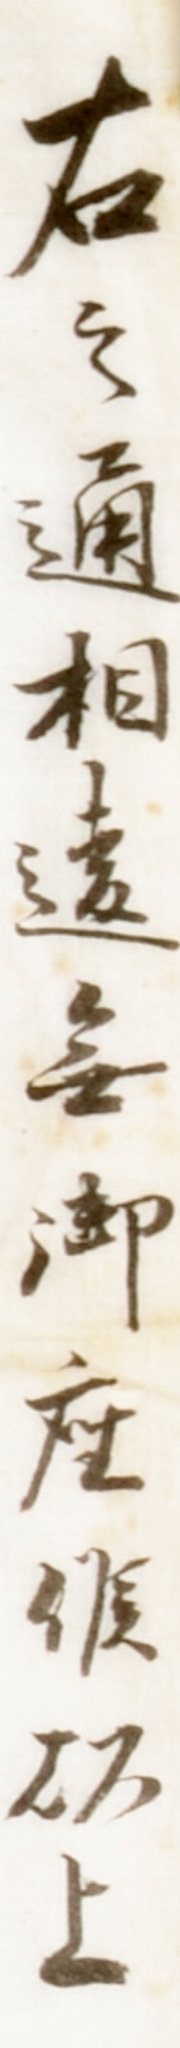右之通相違無御座候以上
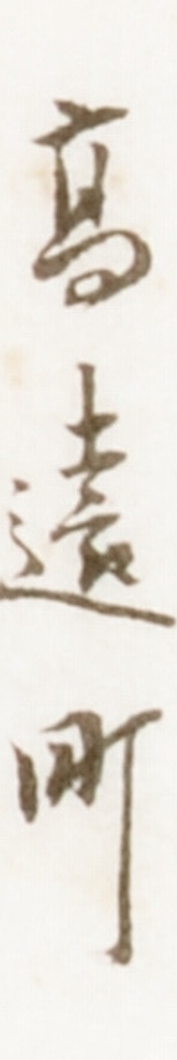高遠町
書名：書上
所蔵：伊那市立高遠町図書館・合同会社AMANE
